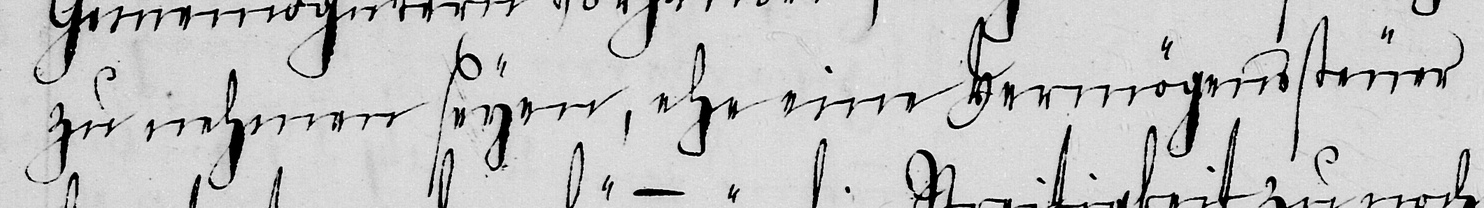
zu nehmen seyen, ehe eine Vermögenssteuer
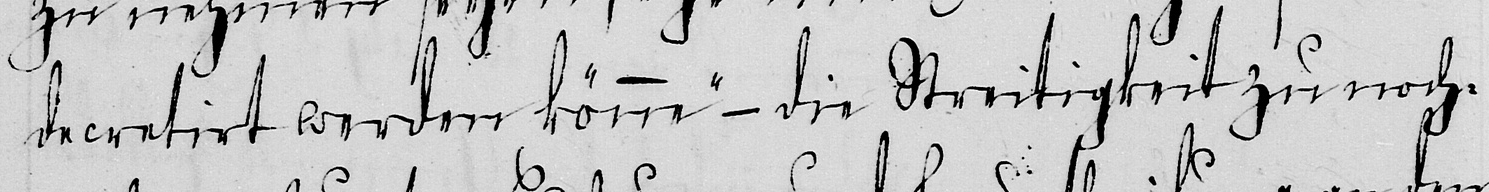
decretirt werden könne“ – die Streitigkeit zu noch¬
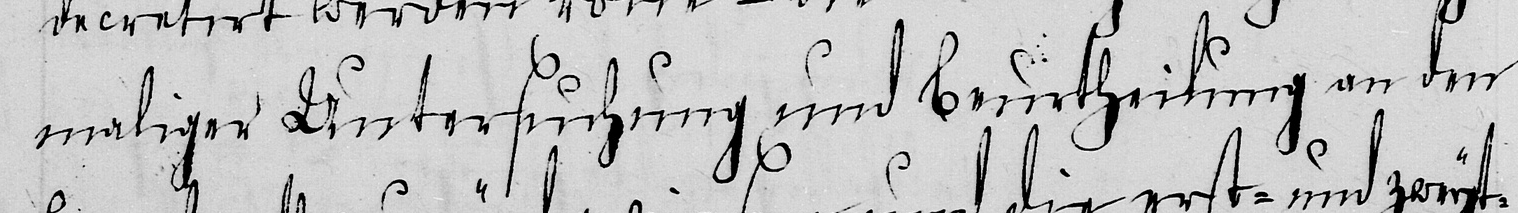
maliger Untersuchung und Beurtheilung an den
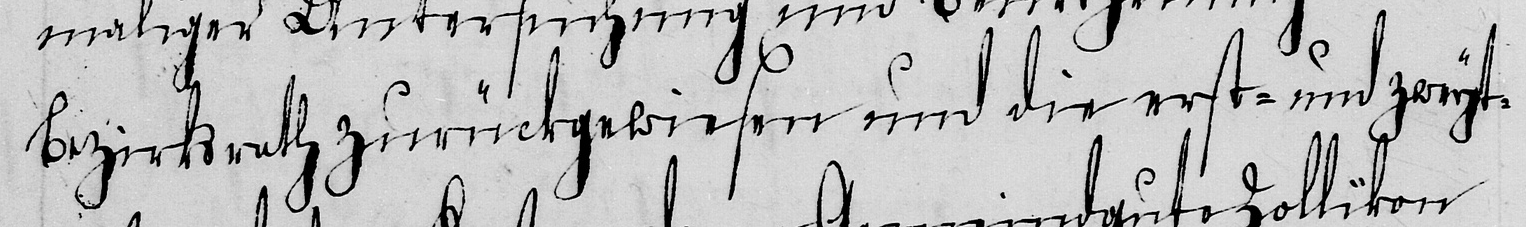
Bezirksrath zurückgewiesen und die erst- und zweyt¬
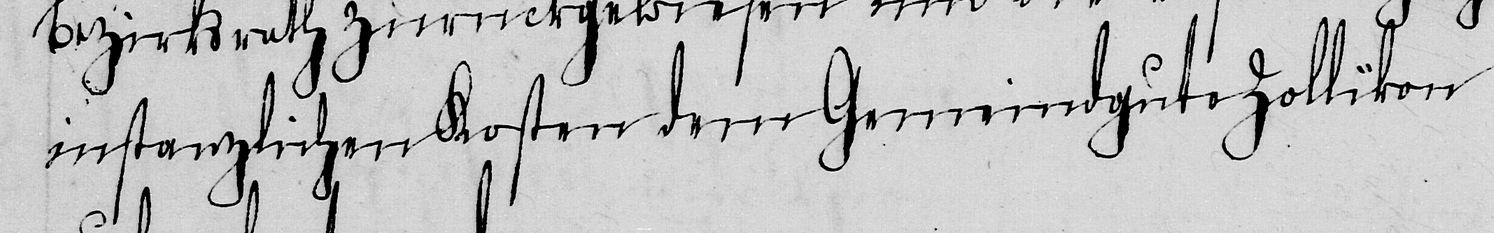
instanzlichen Kosten dem Gemeindgute Zollikon
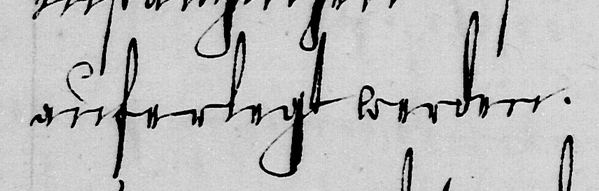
auferlegt werden.
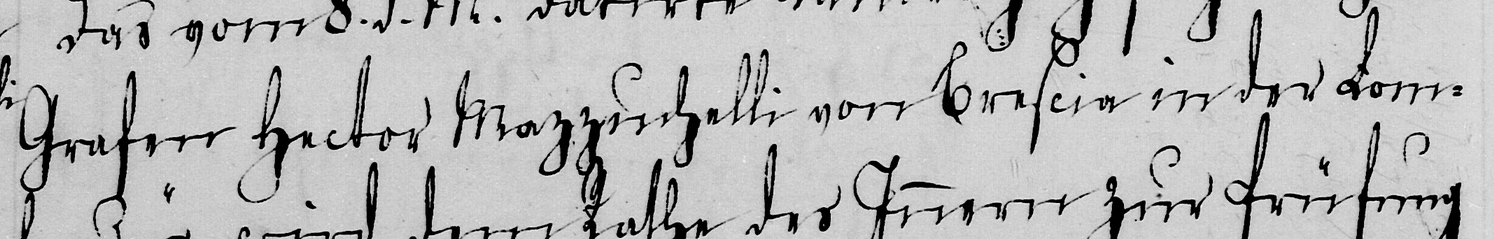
Grafen Hector Mazzuchelli von Brescia in der Lom¬
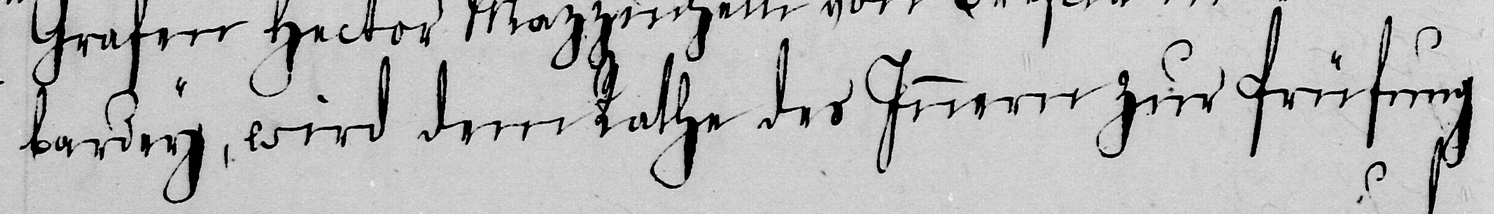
bardey, wird dem Rathe des Innern zur Prüfung
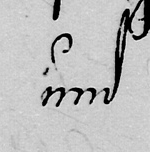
und
